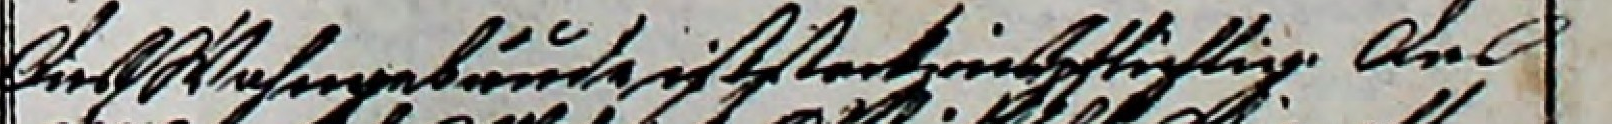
Des Wahngebäude ist starkinspflichtig. das
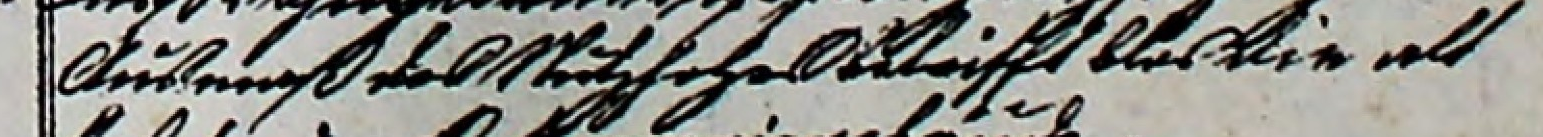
Ausneß des Nutzholzes?eifft bes die alt
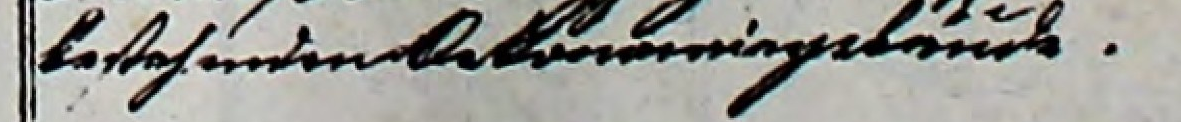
kestehenden Aekommingsbäude.
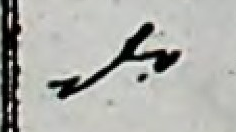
do
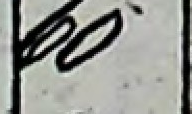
60
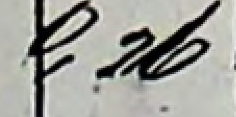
0,26
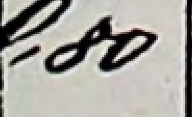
0,80
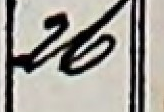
26
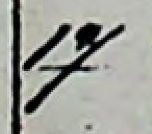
17
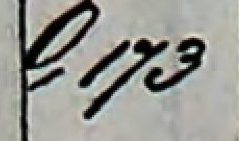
0,173
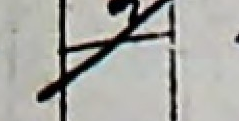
7
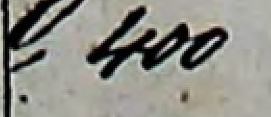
0,400
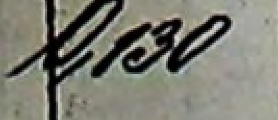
0,130
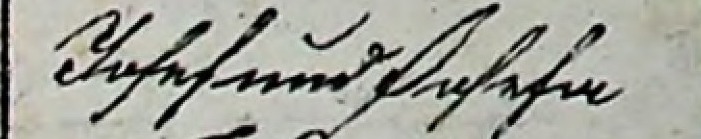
Josef und Josefa
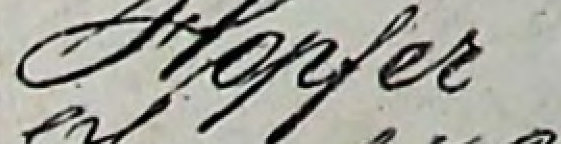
Hopfer
